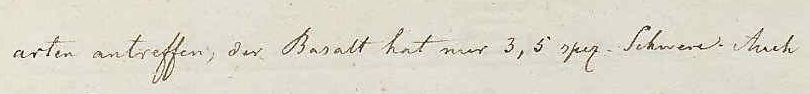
arten antreffen, der Basalt hat nur 3,5 spez. Schwere. Auch
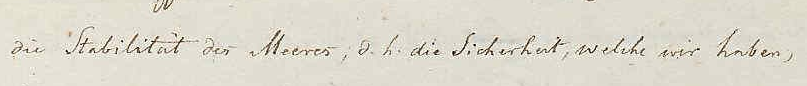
die Stabilität des Meeres, d. h. die Sicherheit, welche wir haben,
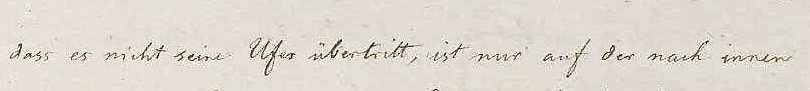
dass es nicht seine Ufer übertritt, ist nur auf der nach innen
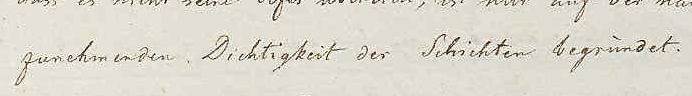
zunehmenden Dichtigkeit der Schichten begründet.
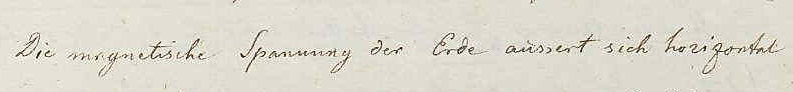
Die magnetische Spannung der Erde äussert sich horizontal
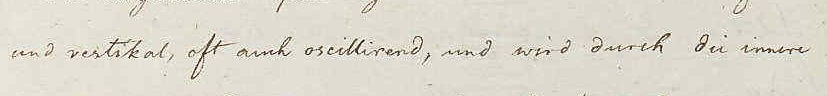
und vertikal, oft auch oscillirend, und wird durch die innere
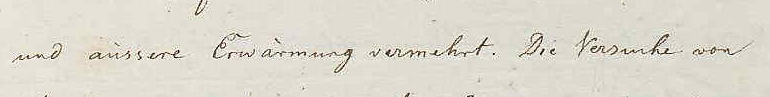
und äussere Erwärmung vermehrt. Die Versuche von
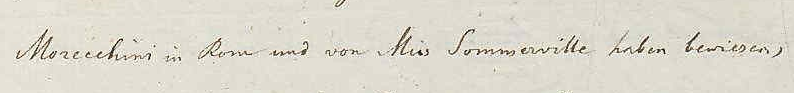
Morecchini in Rom und von Miss Sommerville haben bewiesen,
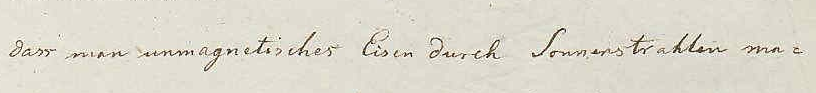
dass man unmagnetisches Eisen durch Sonnenstrahlen ma-
